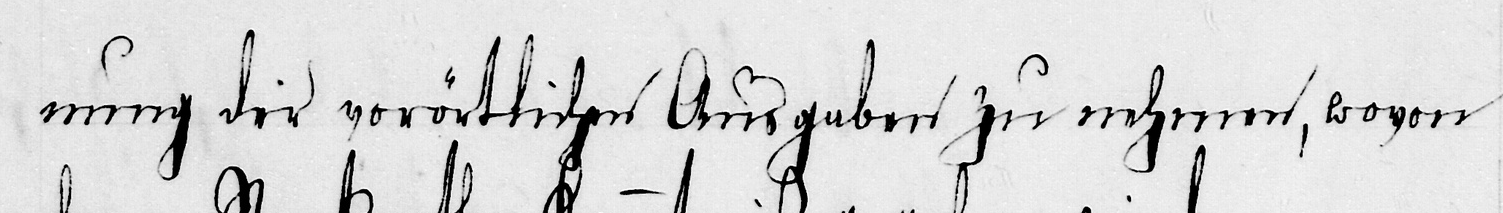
nung der vorörtlichen Ausgaben zu nehmen, wovon
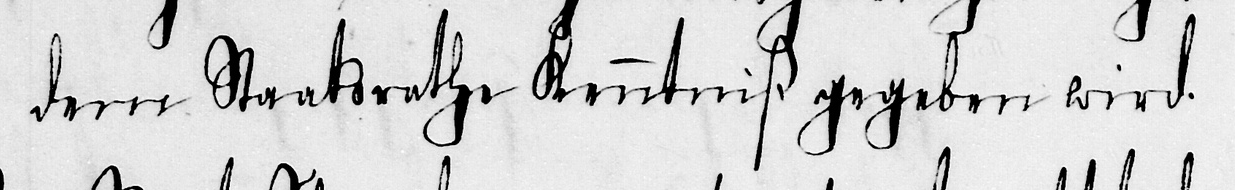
dem Staatsrathe Kenntniß gegeben wird.
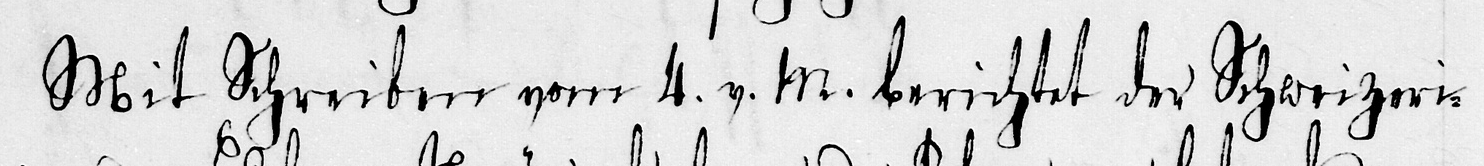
Mit Schreiben vom 4. v. M. berichtet der Schweizeri¬
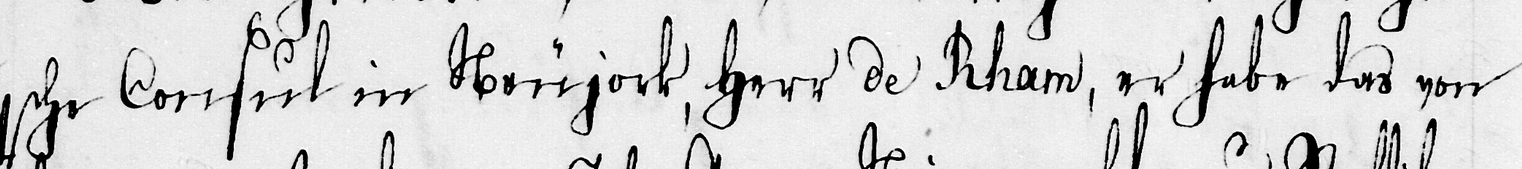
sche Consul in Neujork, Herr de Rham, er habe das von
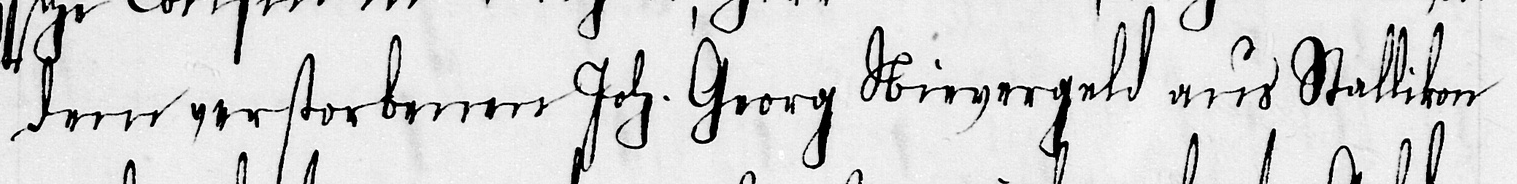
dem verstorbenen Joh. Georg Nievergeld aus Stallikon
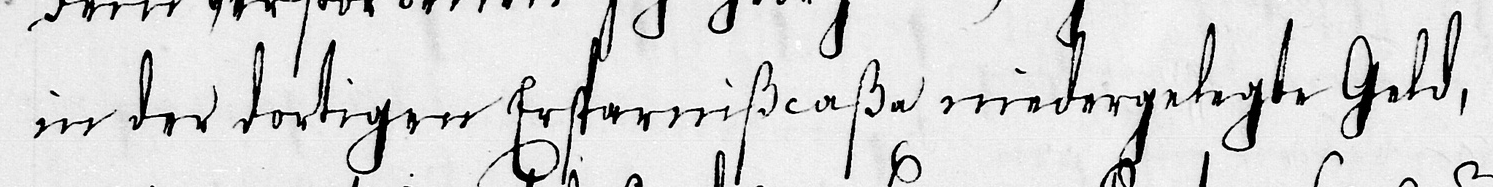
in der dortigen Ersparnißcaßa niedergelegte Geld,
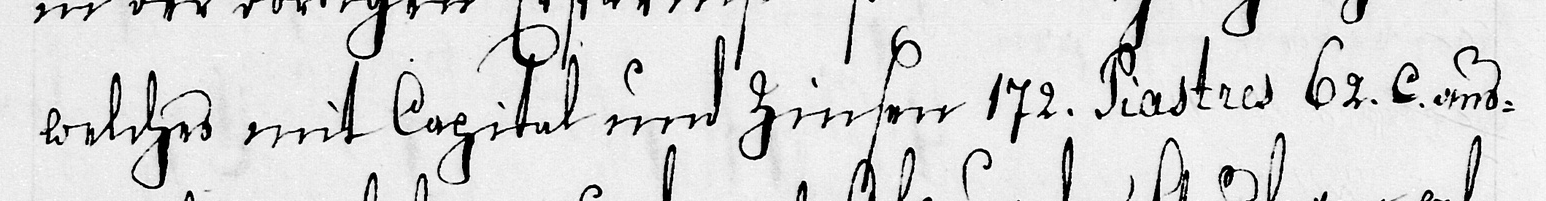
welches mit Capital und Zinsen 172. Piastres 62. C. aus¬
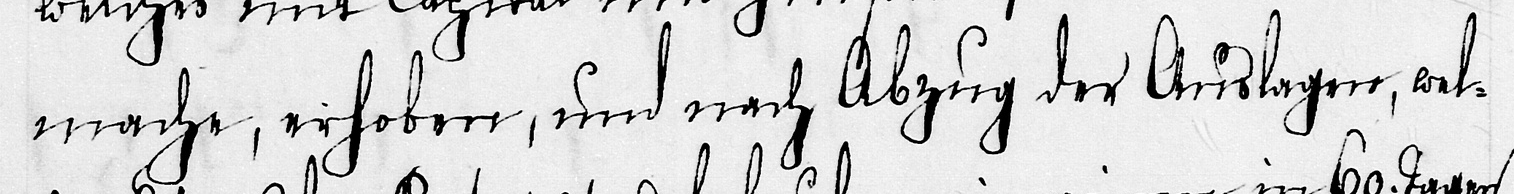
mache, erhoben, und nach Abzug der Auslagen, wel¬
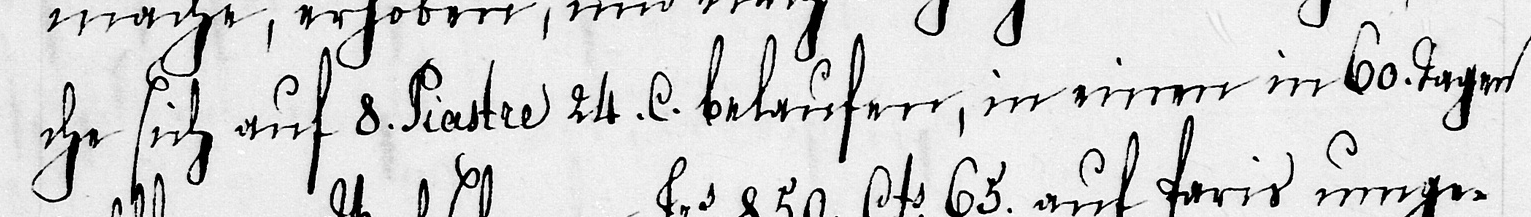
che sich auf 8. Piastre 24. C. belaufen, in einen in 60. Tagen
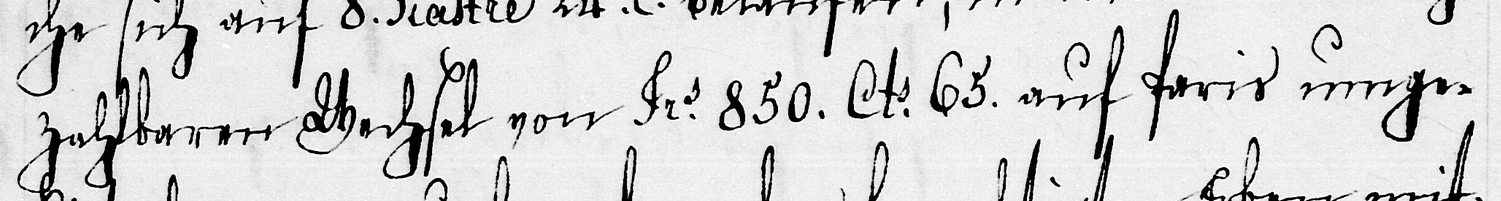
zahlbaren Wechsel von Frs. 850. Cts. 65. auf Paris umge¬
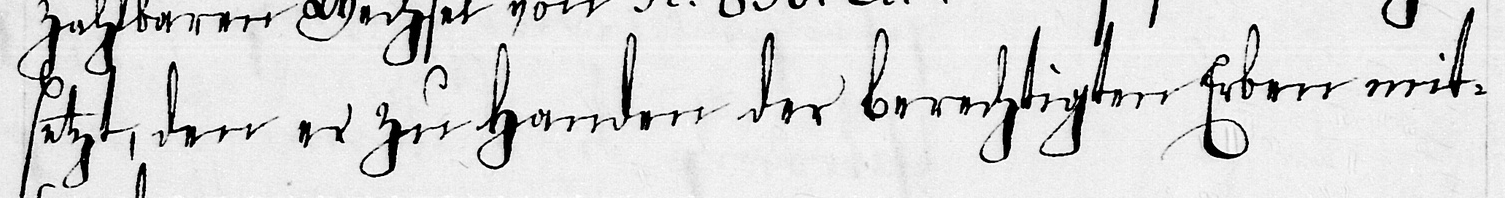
setzt, den er zu Handen der berechtigten Erben mit¬
